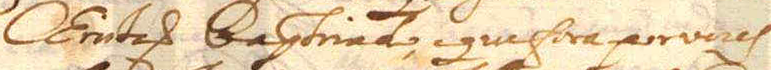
Christaõ baptizado, e que fora por vezes
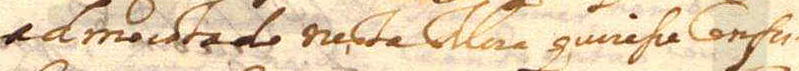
admoestado nesta Meza quizesse Confes
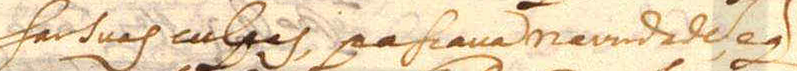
sar suas culpas, passaua na verdade, e q̄
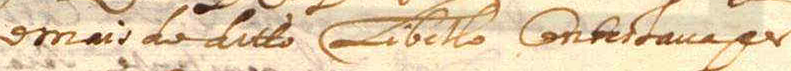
o mais do ditto Libello Contestaua por
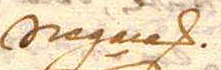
negaçaõ.
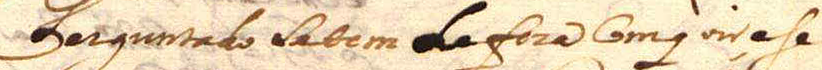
Perguntado se tem defeza Com q̄ vir, e se
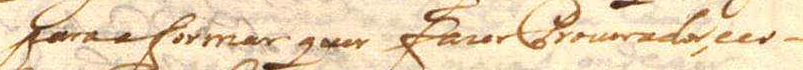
para a formar quer fazer Procurador, e es
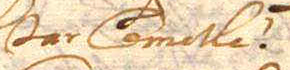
tar Com elle?
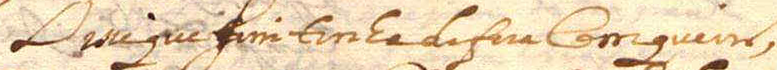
Disse que sim tinha defeza Com que ir,
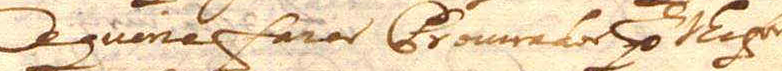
e queria fazer Procurador pa lhe for
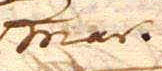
mar.
